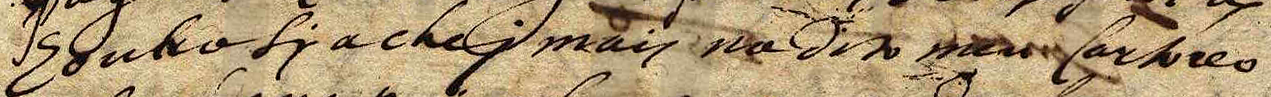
E outrosy achej mais no dito meu Cartoreo
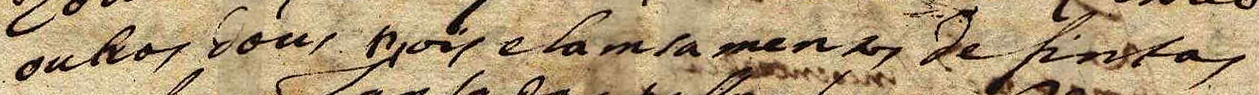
outros dous Rois e lamsamentos de fintas
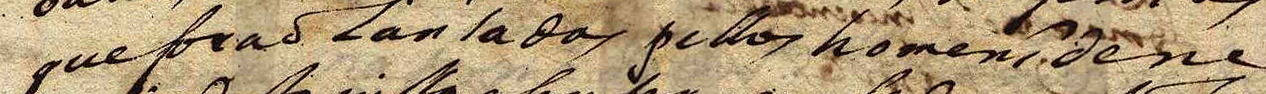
que foraõ lansadas pellos homens de ne
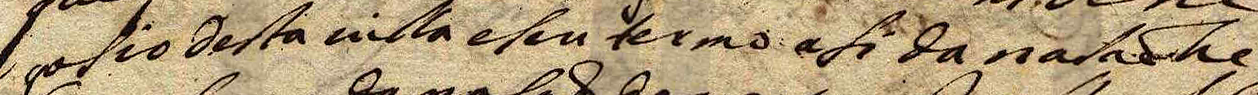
gosio desta uilla e seu termo asi da nasaõ he
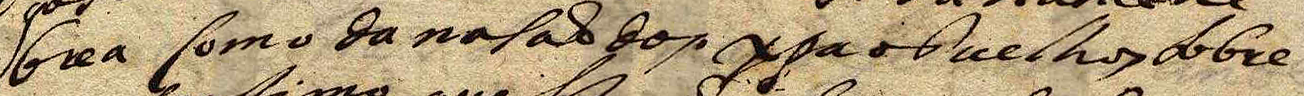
brea Como da nasaõ dos xpaos̄ uelhos sobre
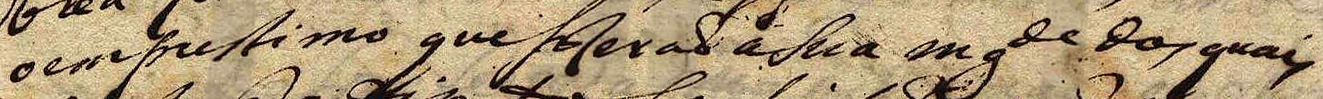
o emprestimo que fizeraõ a sua mgde dos quais
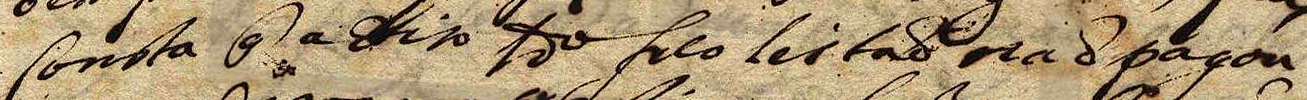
Consta q̄ o dito ldo frco leitaõ naõ pagou
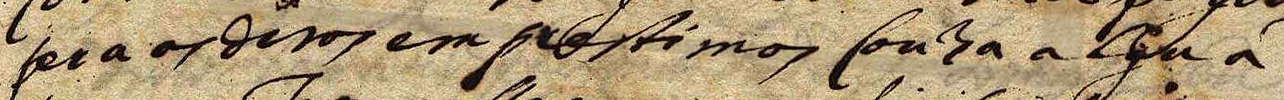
pera os ditos emprestimos Couza alguā
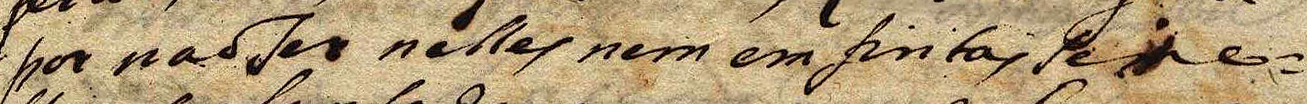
por naõ ser nelles nem em fintas seme
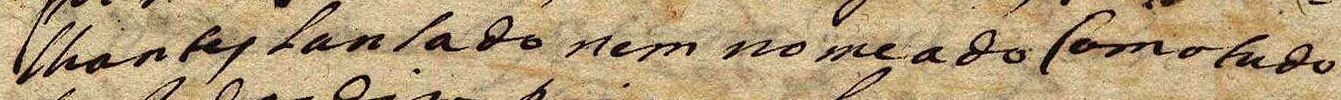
lhantes lansado nem nomeado Como tudo
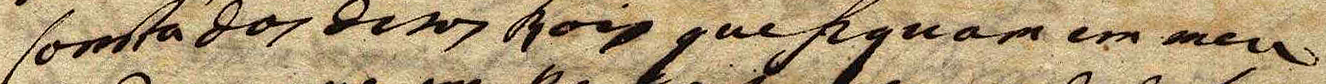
Consta dos ditos Rois que fiquam em meu
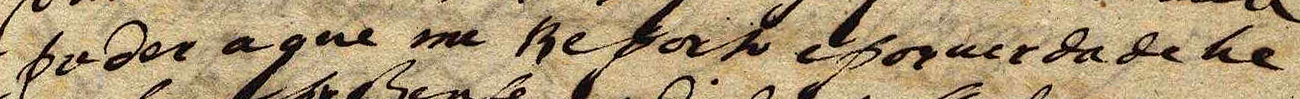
puder a que me Reporto e por uerdade he
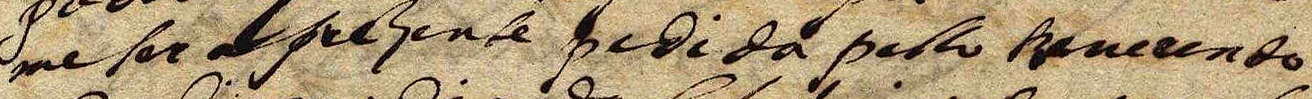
me ser a prezente pedida pello Reuerendo
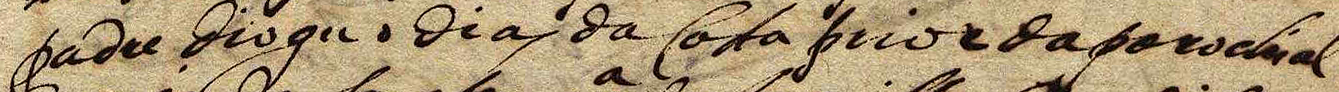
padre dioguo dias da Costa prior da parochial
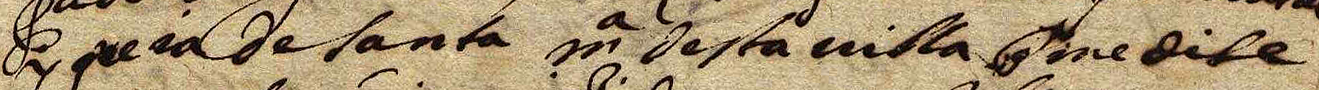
ygreia de santa ma desta uilla q̄ me dise
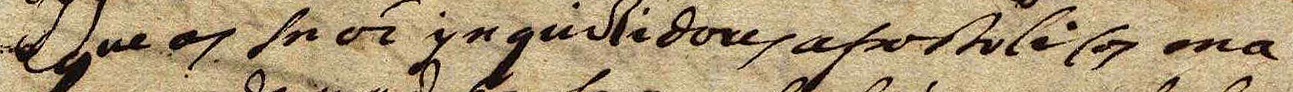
que os snor̄ ynquizidores apostolicos ma
